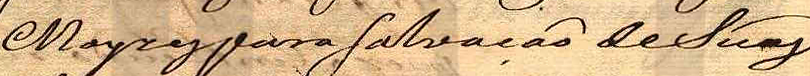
Moyzes para salvaçaõ de Suas
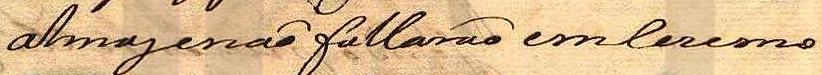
almas e naõ fallarão em Ceremo
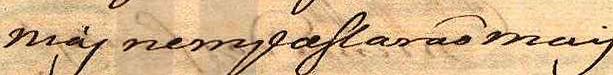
nias nem passarão mais
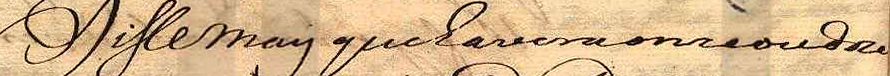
Disse mais que havera onze ou doze
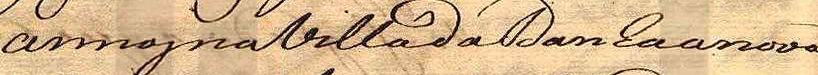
annos na Villa da Idanha a nova
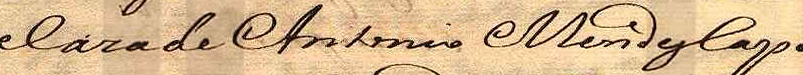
e Caza de Antonio Mendes Capo
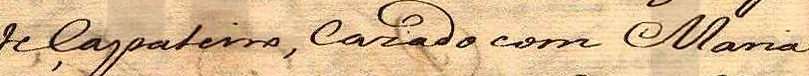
te Çapateiro, Cazado com Maria
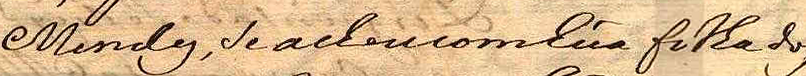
Mendes, se achou com hūa filha dos
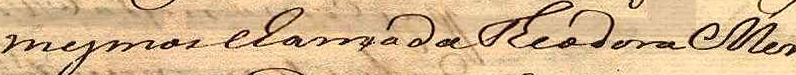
mesmos chamada Theodora Men
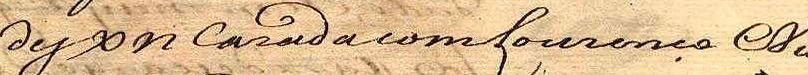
des xn cazada com Lourenço Nu
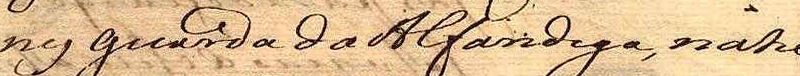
nes guarda da Alfandega, natu
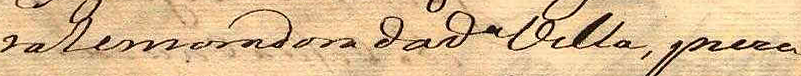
ral e moradora da da Villa, preza
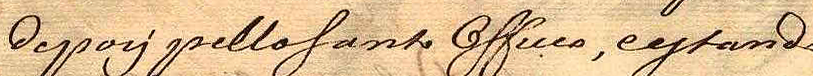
depois pello santo Offiçio, e estando
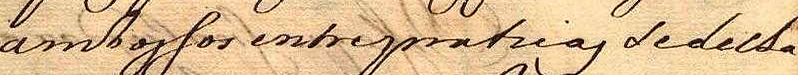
ambos sos entre praticas se decla
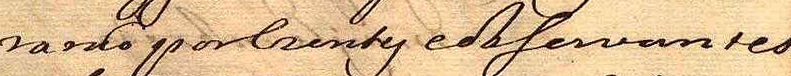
raraõ por Crentes e observantes
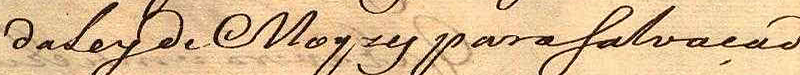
da Ley de Moyzes para salvaçaõ
